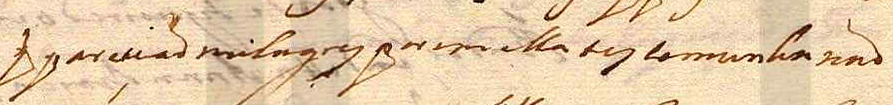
q̄ pareçiaõ milagres porem ella testemunha naõ
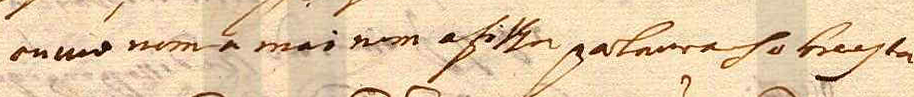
ouuio nem a mai nem a filha palavra sobre esta
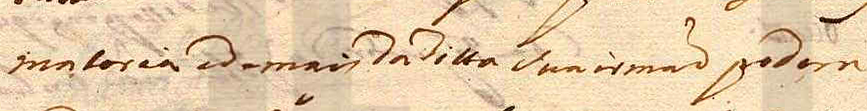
materia, e de mais da ditta sua irmaõ podera
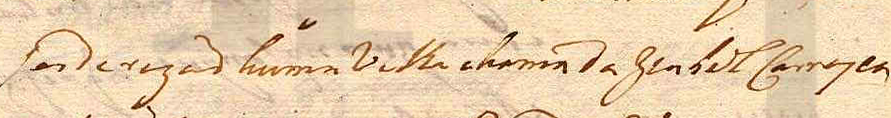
ser de rezão huma velha chamada Jzabel Carrasca
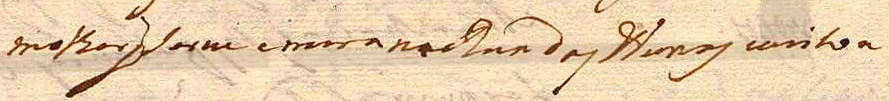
molher q̄ serue e mora na Rua das Nunas iunto a
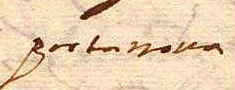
porta noua
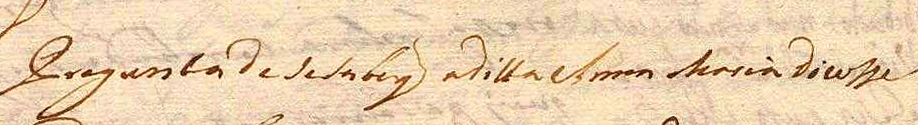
Preguntada se sabe q̄ a ditta Anna Maria dicesse
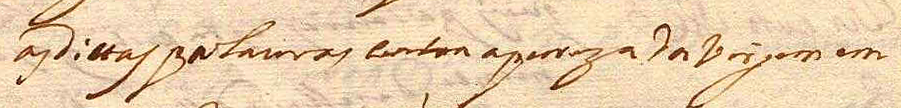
as dittas palauras contra a pureza da Virgem em
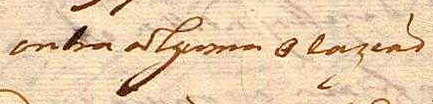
contra alguma ocaziaõ
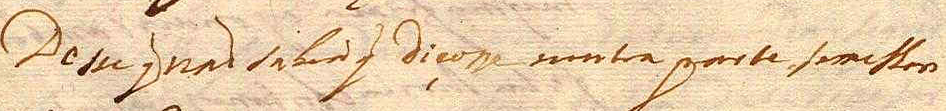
Desse q̄ não sabia q̄ diçesse noutra parte semelhan
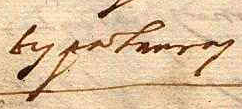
tes palauras
